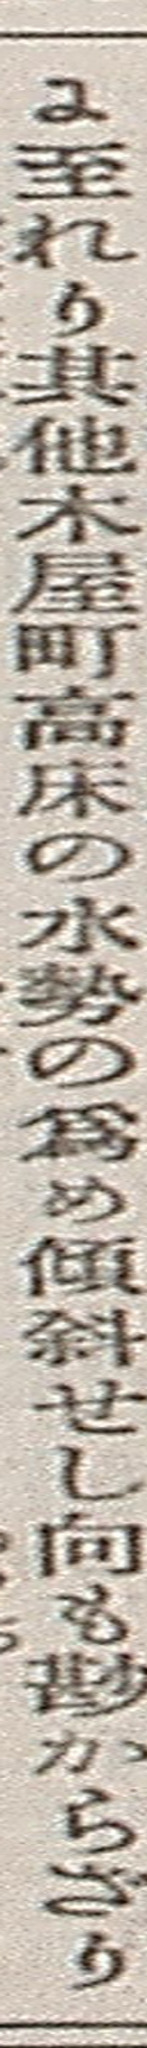に至れり其他木屋町高床の水勢の為め傾斜せし向も尠からざり
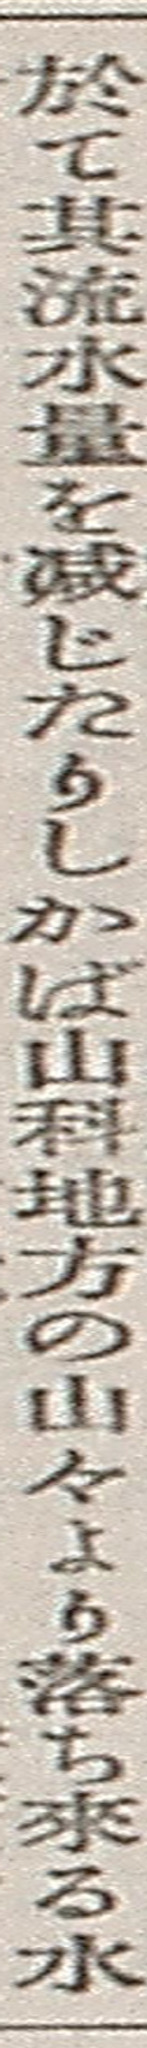於て其流水量を減じたりしかば山科地方の山々より落ち来る水
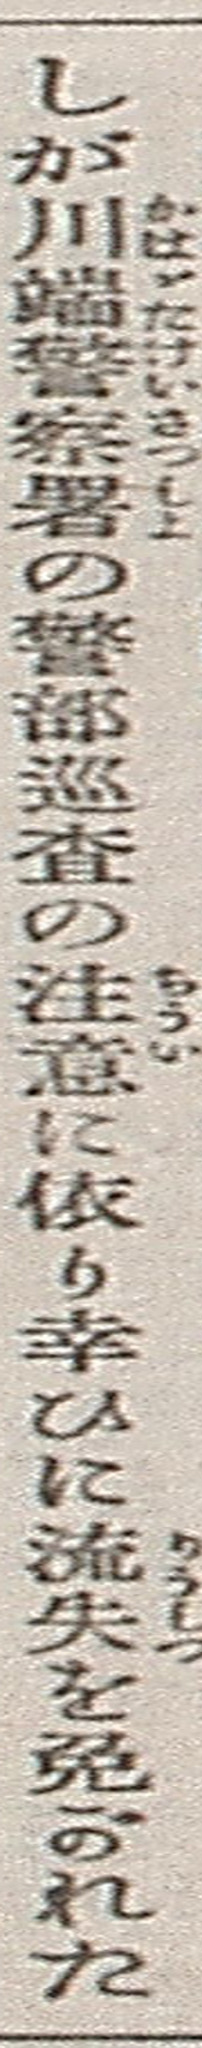しが川端警察署の警部巡査の注意に依り幸ひに流失を免がれた
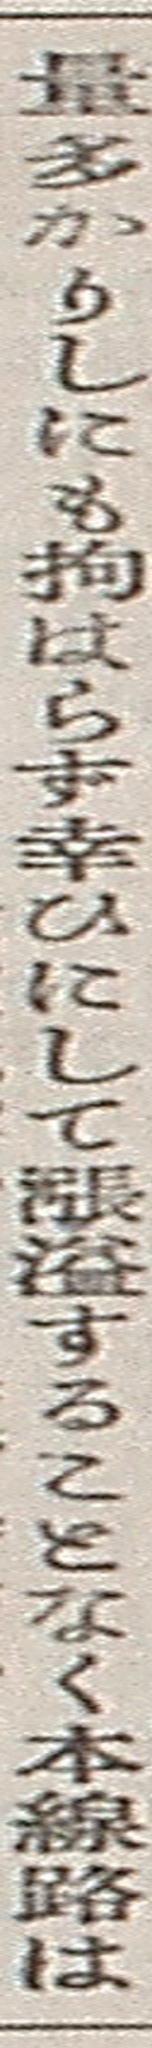量多かりしにも拘はらず幸ひにして漲溢することなく本線路は
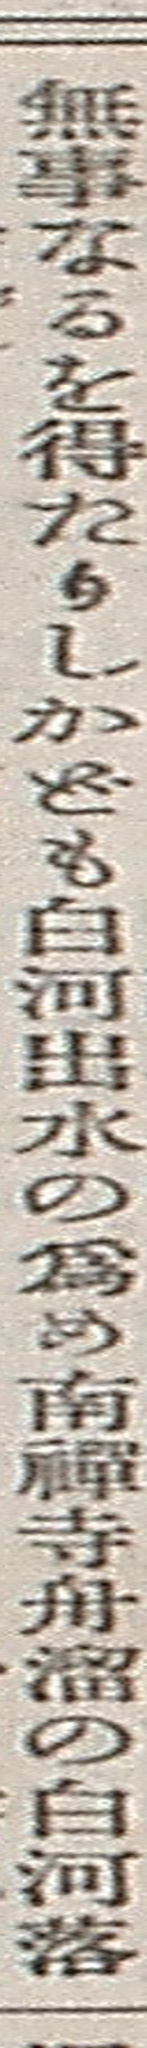無事なるを得たりしかども白川出水の為め南禅寺舟溜の白川落
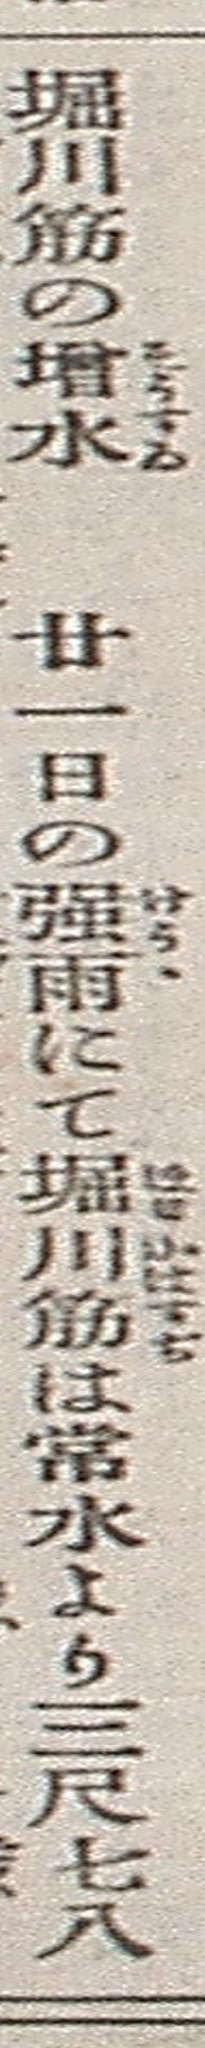堀川筋の増水廿一日の強雨にて堀川筋は常水より三尺七八
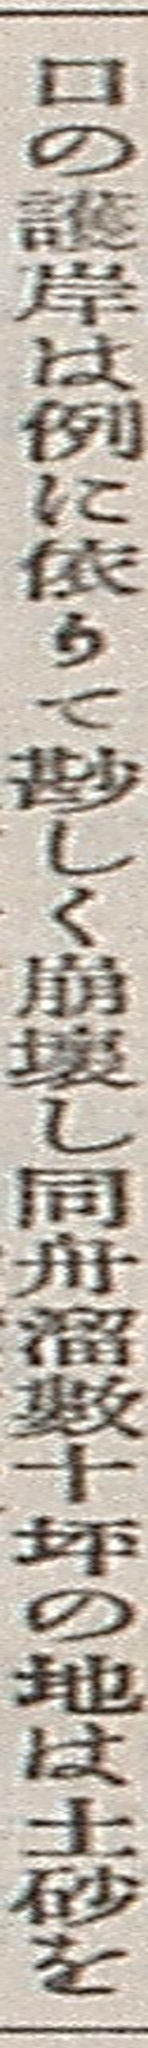口の護岸は例に依りて尠しく崩壊し同舟溜数十坪の地は土砂を
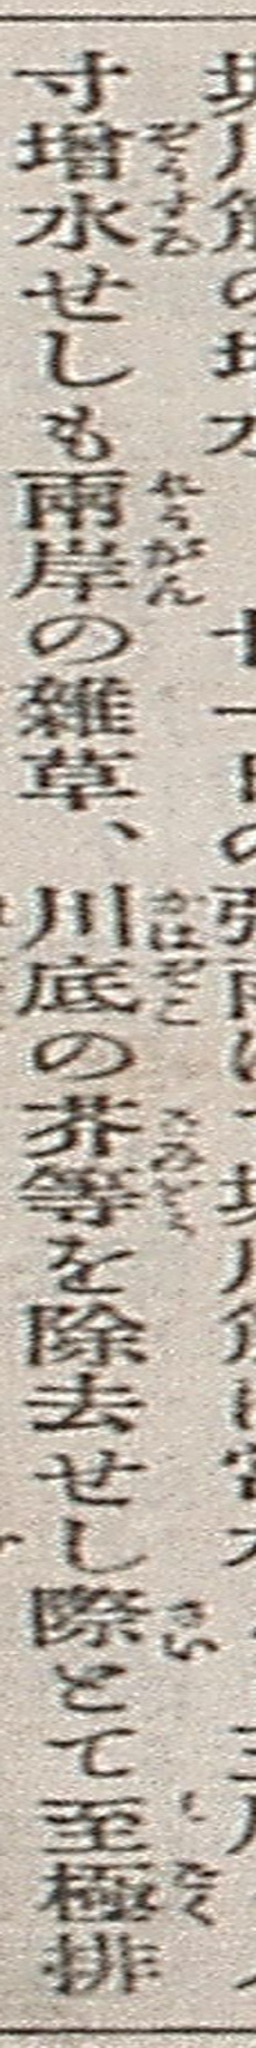寸増水せしが両岸の雑草、川底の芥等を除去せし際とて至極排
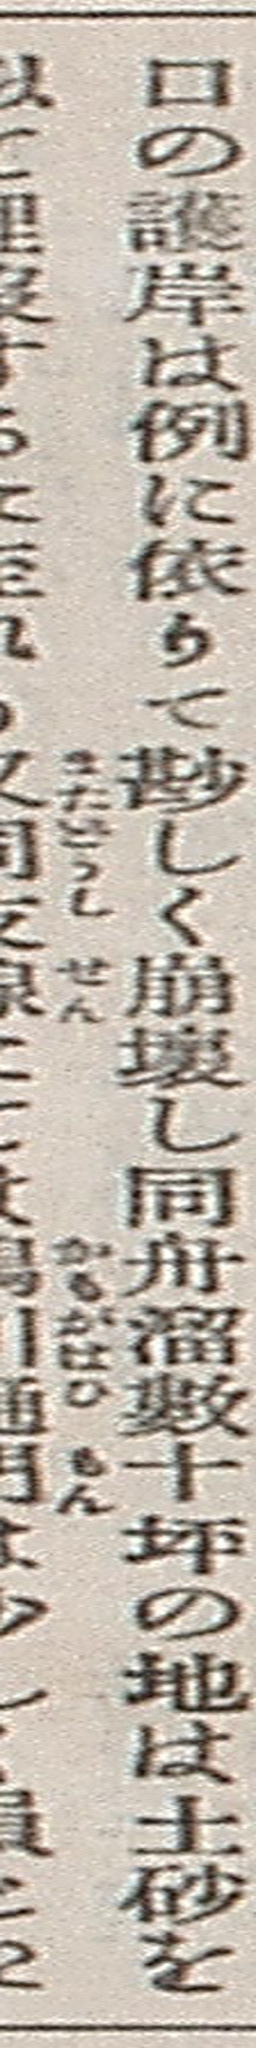以て埋没するに至れり又同支線にては鴨川樋門は少しく損じた
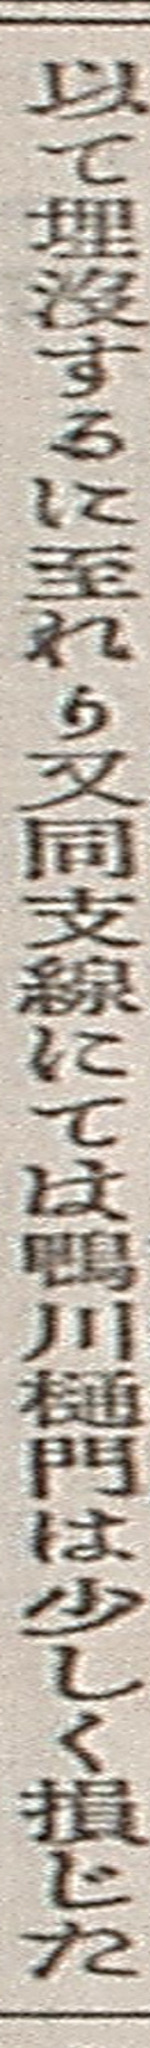以て埋没するに至れり又同支線にては鴨川樋門は少しく損じた
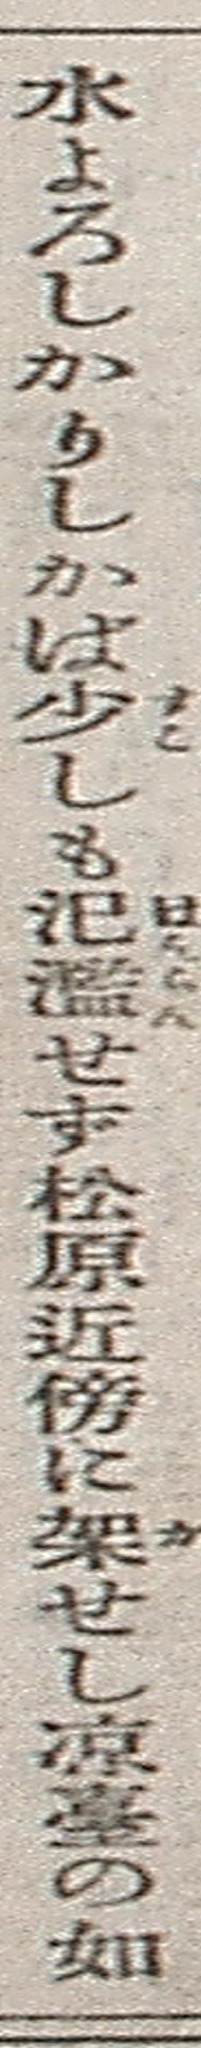水よろしかりしかば少しも氾濫せず松原近傍に架せし凉台の如

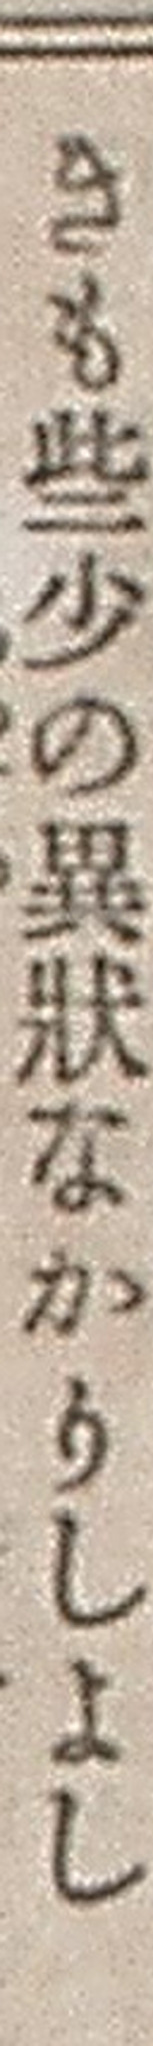きも些少の異状なかりしよし
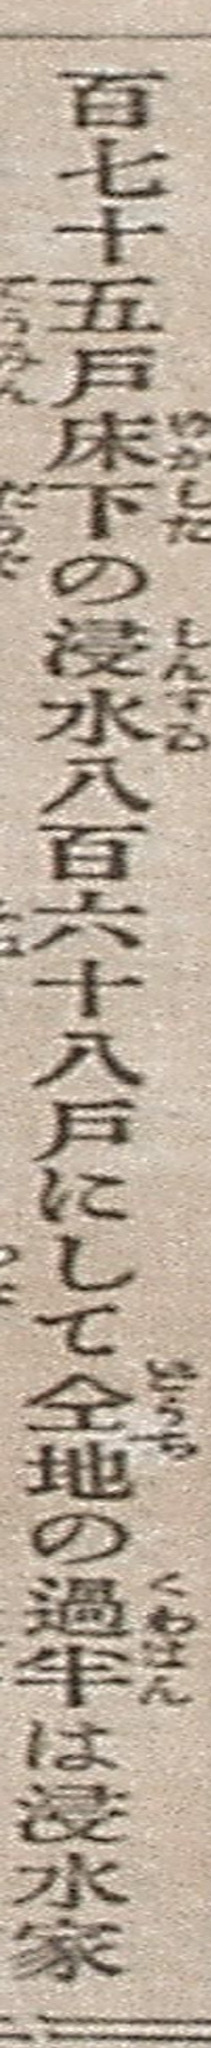百七十五戸床下の浸水八百六十八戸にして同地の過半は浸水家
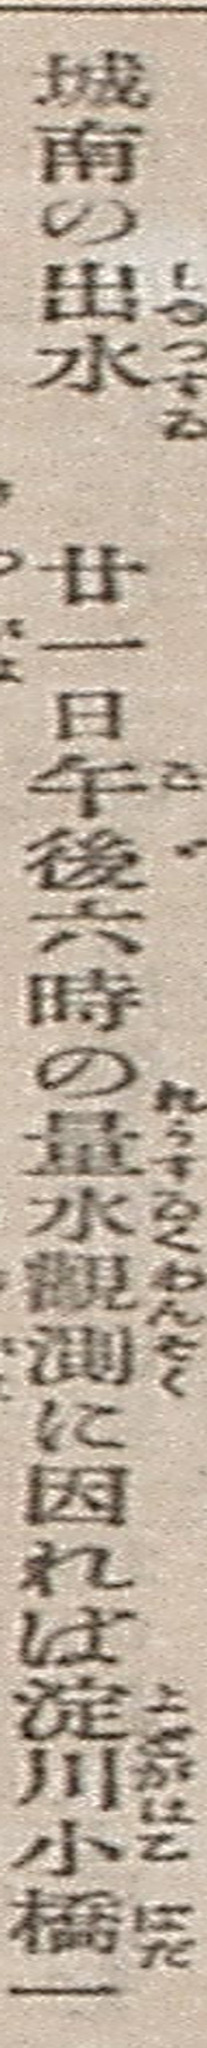城南の出水廿一日午後六時の量水観測に因れば淀川小橋一
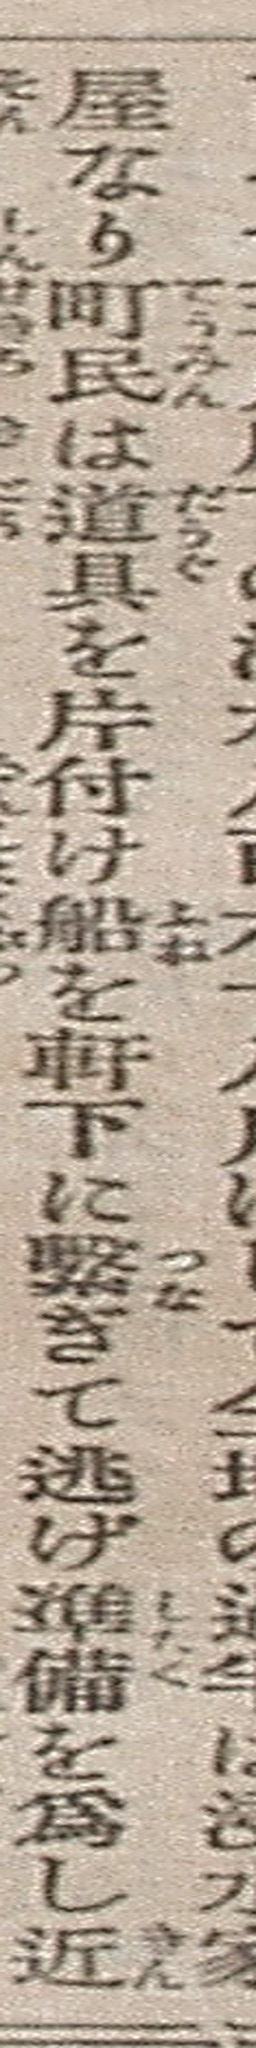屋なり町民は道具を片付け船を軒下に繋ぎて逃げ準備を為し近
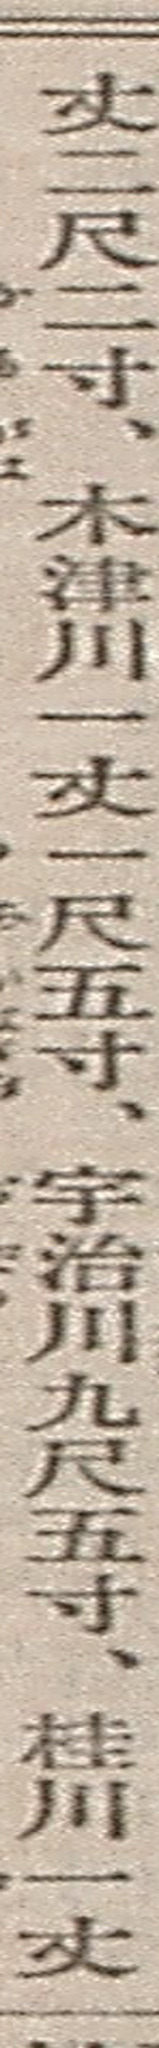丈二尺二寸、木津川一丈一尺五寸、宇治川九尺五寸、桂川一丈
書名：風俗畫報臨時増刊第百二十八號　洪水被害録（下）
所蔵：東京大学地震研究所図書室 Earthquake Research Institute Library, The University of Tokyo, JAPAN
